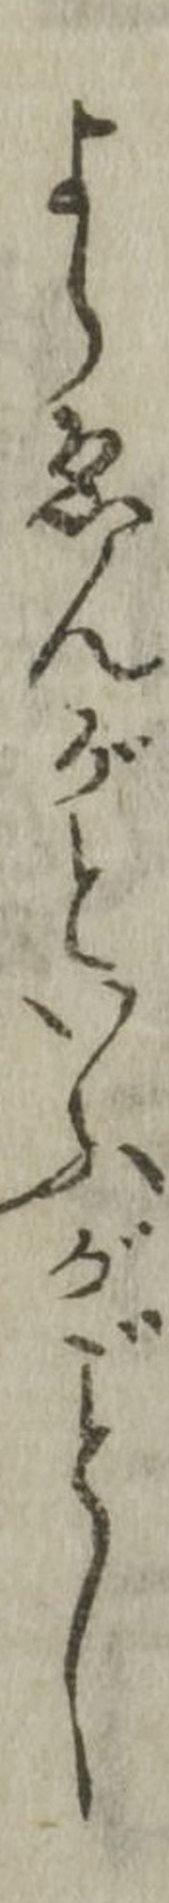よらゑんがといふがごとし
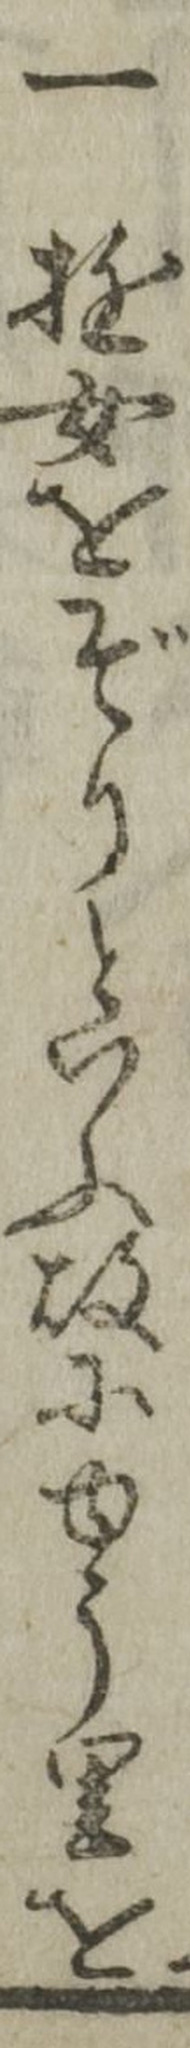一遊女をぞりといふ故にゆう里を
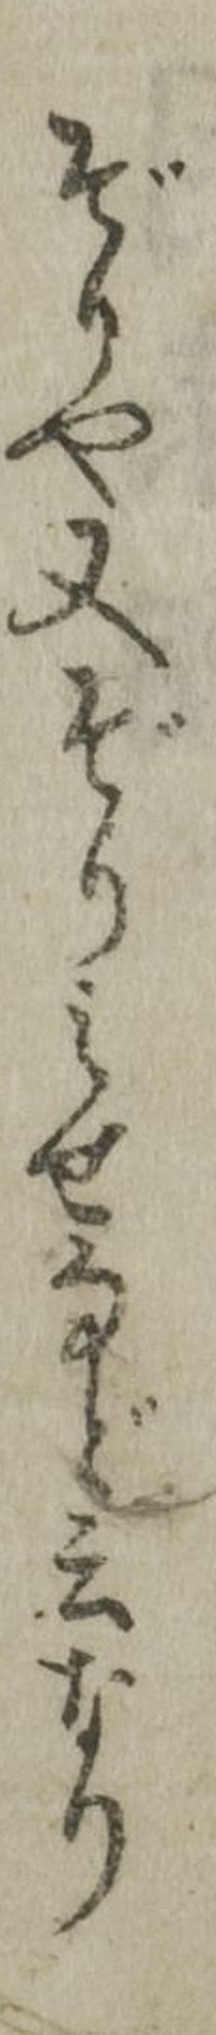ぞりや又ぞりみせなど云なり

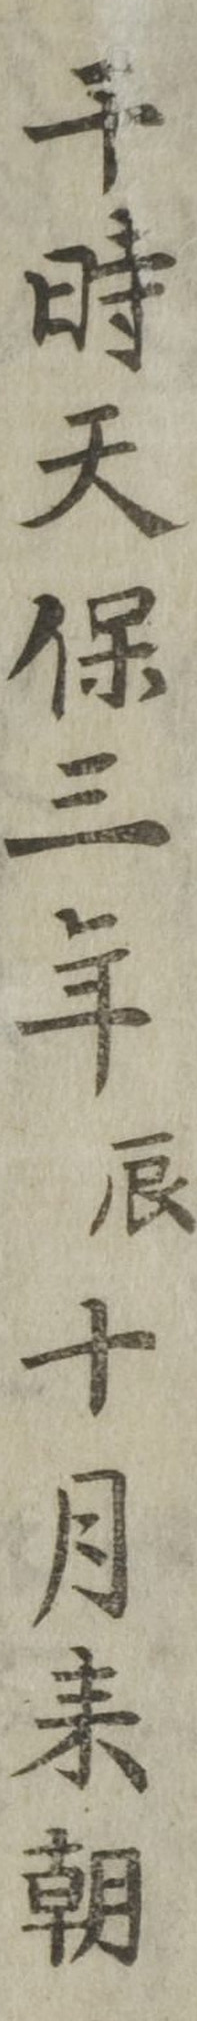干時天保三年辰十月来朝
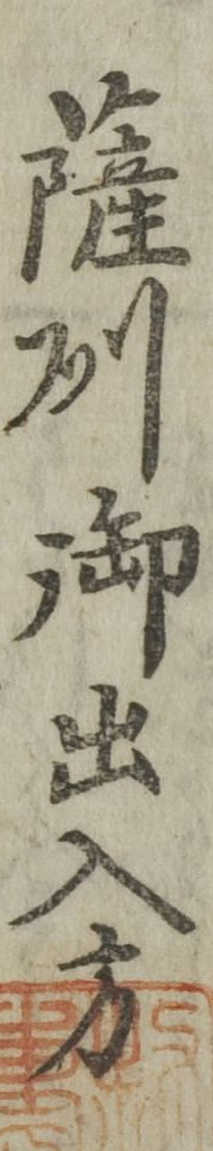薩州御出入方
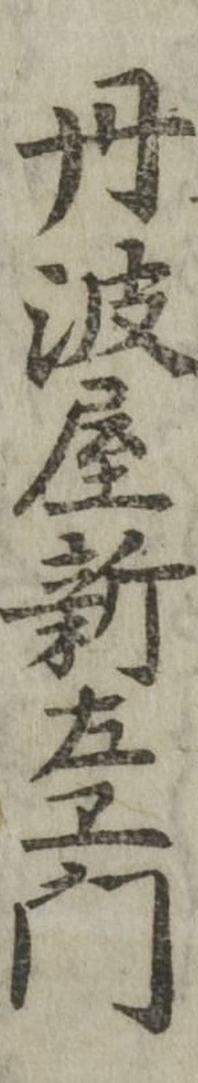丹波屋新左ヱ門
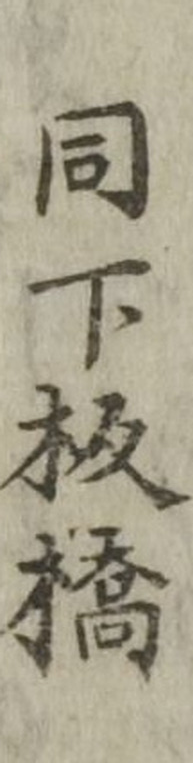同下板橋
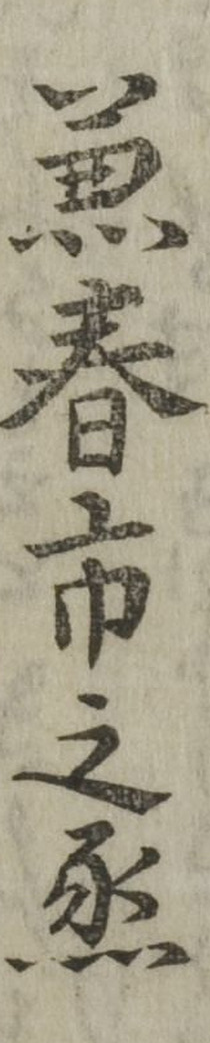兼春市之丞
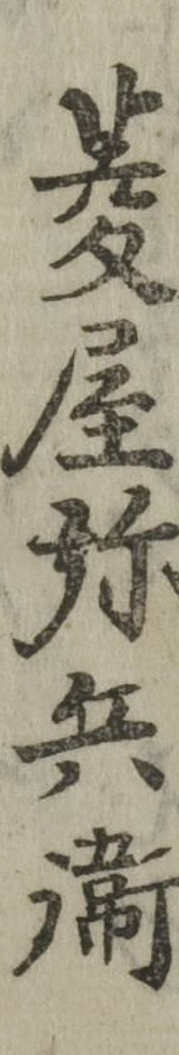菱屋弥兵衛
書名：琉球人行列記 天保3年
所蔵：University of the Ryukyus Library
